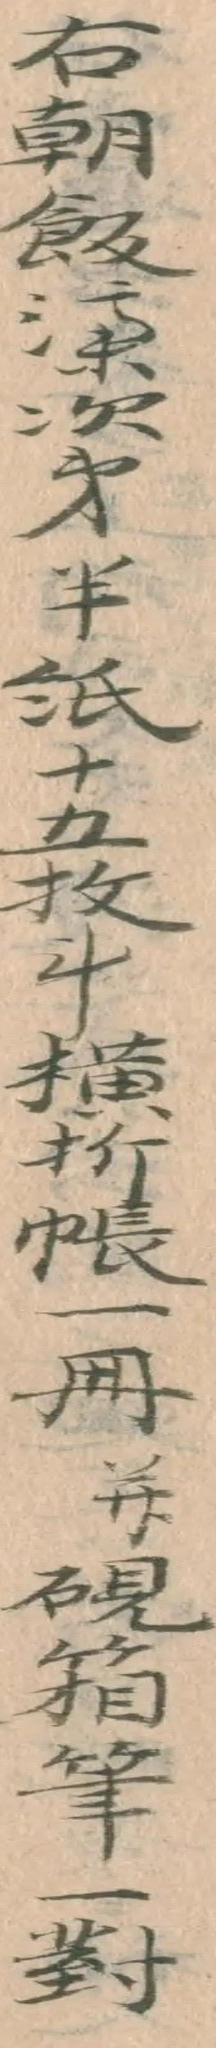右朝飯済次第半紙十五枚斗横折帳一冊并硯箱筆一對
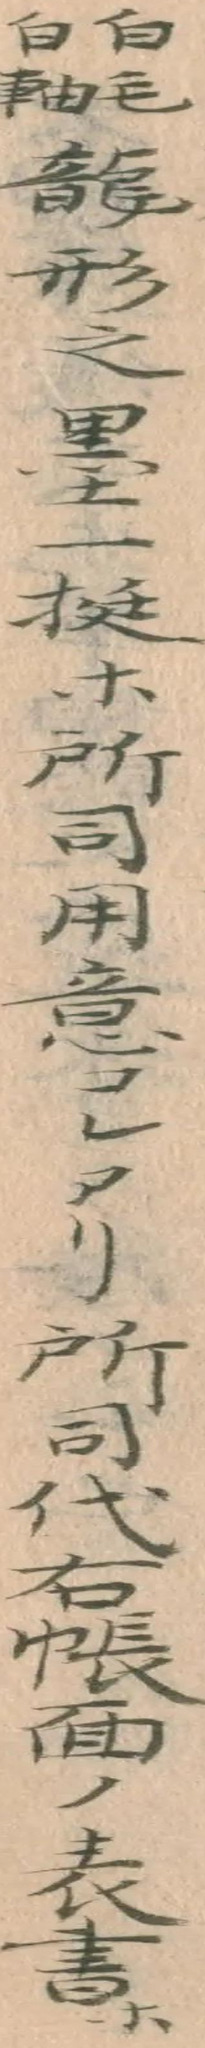白毛白軸籠形之墨一挺等所用意コレアリ所司代右帳面ノ表書ハ
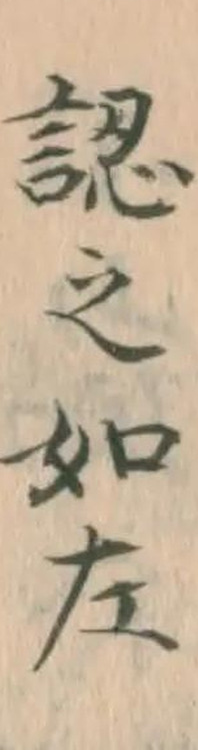認之如左
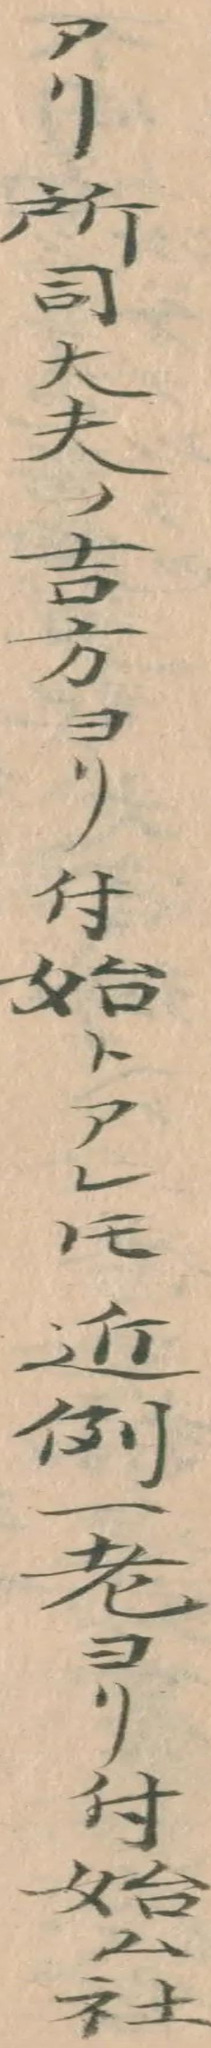アリ所司大夫ノ吉方ヨリ付始トアレトモ近例一老ヨリ付始ム社
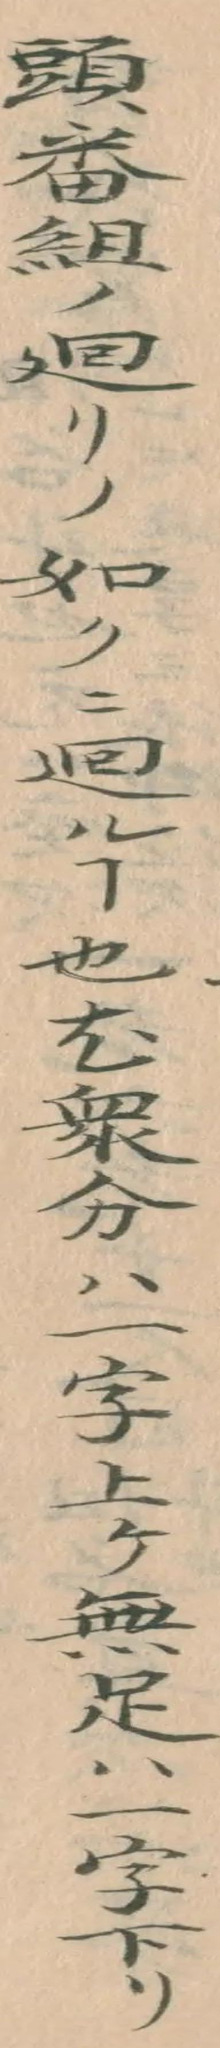頭番組ノ廻リノ如クニ廻ルコト也尤衆分ハ一字上ケ無足ハ一下リ
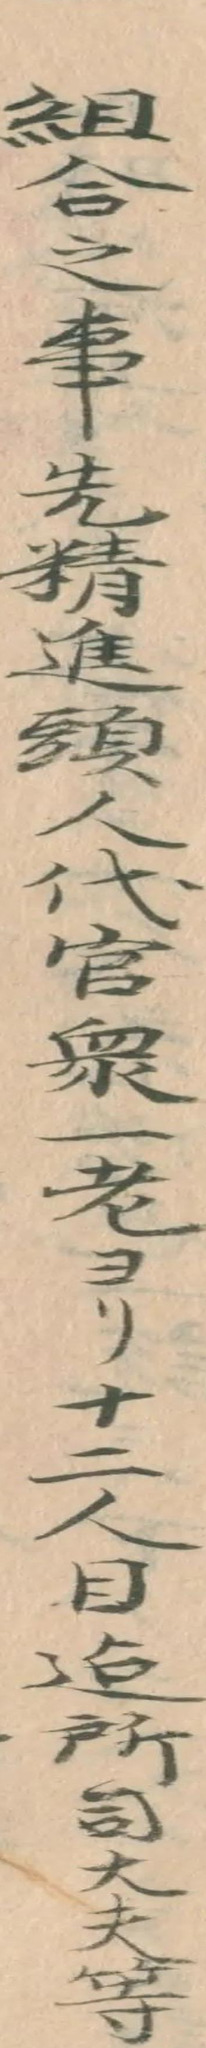一組合之事先精進頭人代官衆一老ヨリ十二人目迄所司大夫等
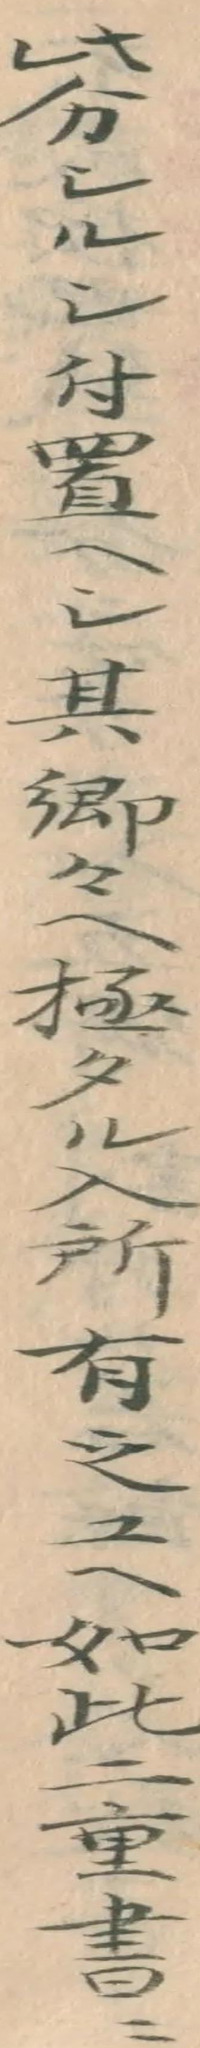此分シルシ付置ヘシ其郷々ヘ極タル入所有之ユヘ如此二重書ニ

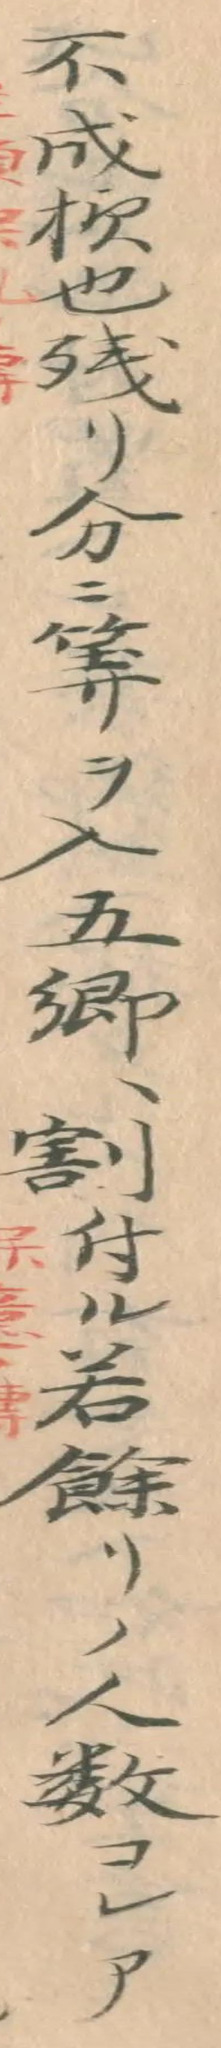不成様也残リ分ニ筭ヲ入五郷へ割付ル若餘リノ人数コレア
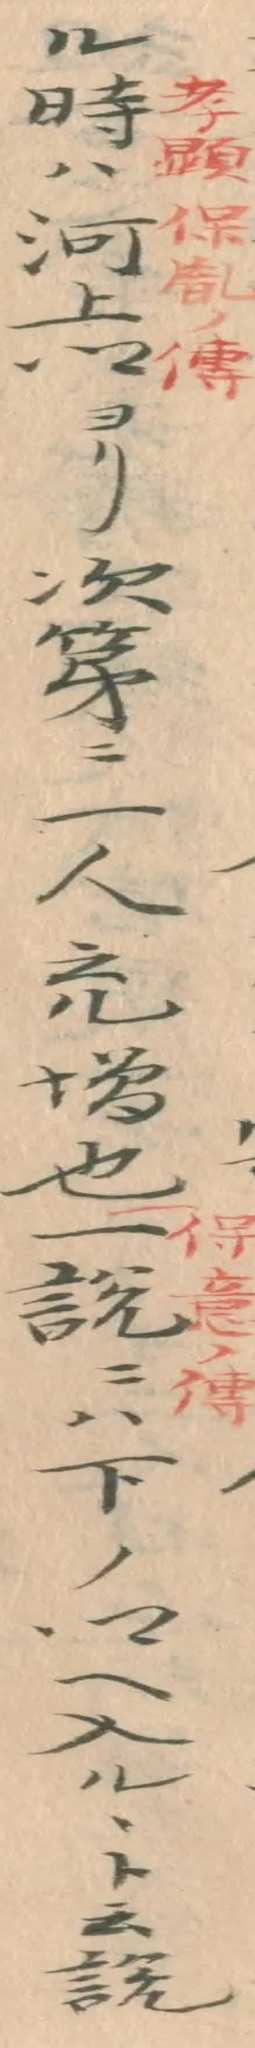ル時ハ河上郷ヨリ次第ニ一人充増也一説ニハ下ノ郷ヘ入ルヽト云説
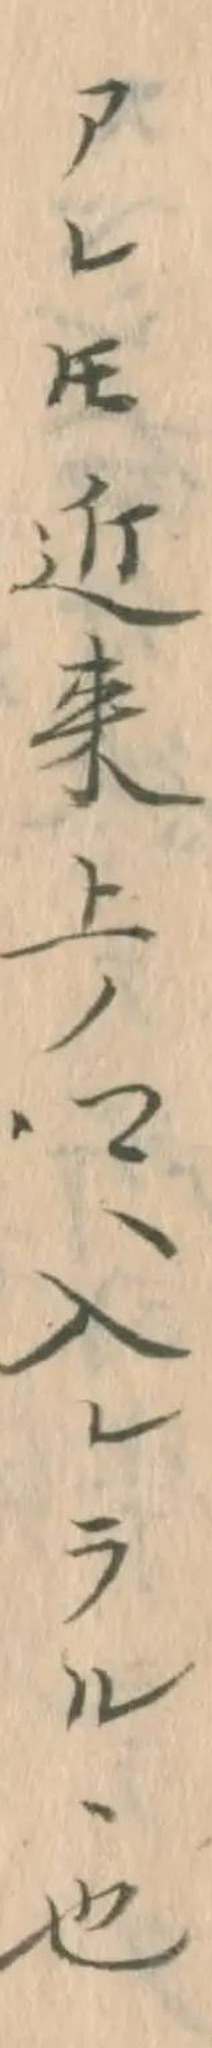アレトモ近来上ノ卿ヘ入レラルヽ也
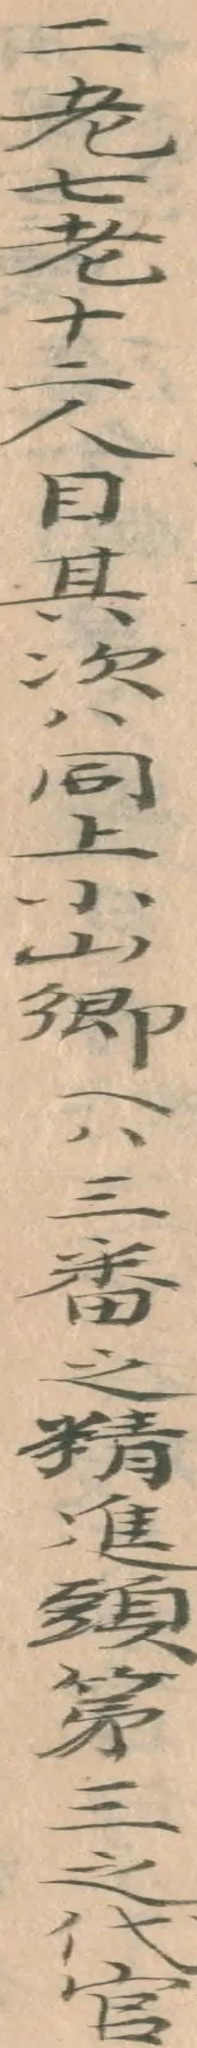二老七老十二人目其次ハ同上小山郷へは三番之精進頭第三之代官
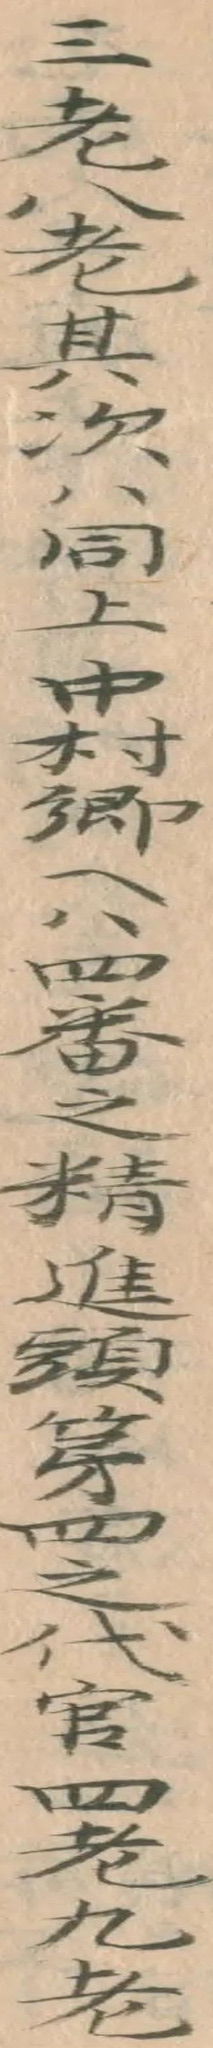三老八老其次ハ同上中村郷ヘハ四番之精進頭第四之代官四老九老
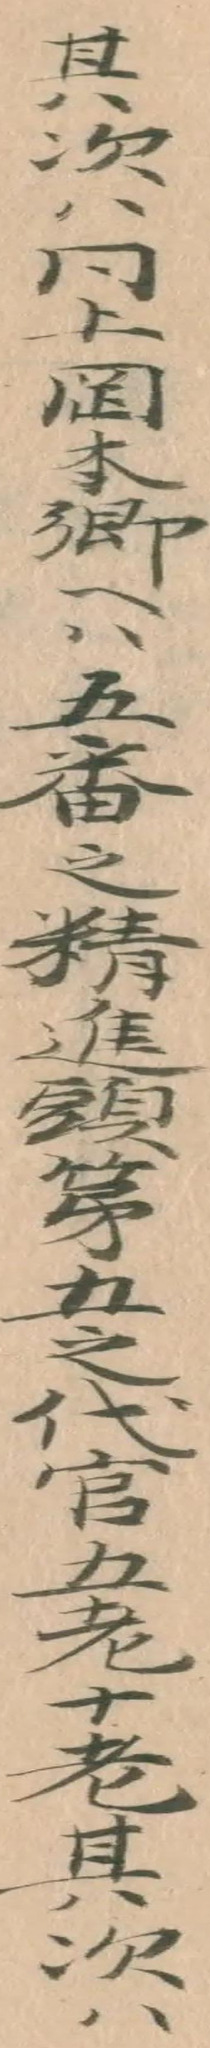其次ハ同上岡本郷ヘハ五番之精進頭第五之代官五老十老其次
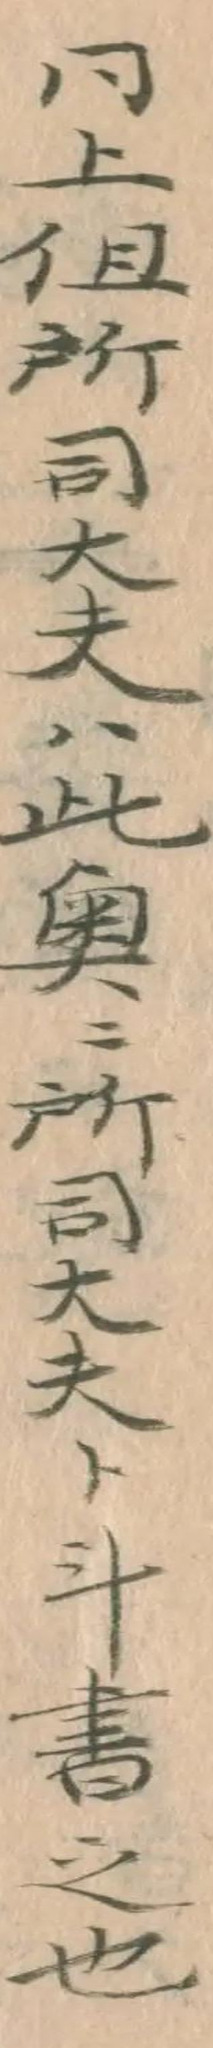同上但所司大夫ハ此奥に所司大夫ト斗書之也
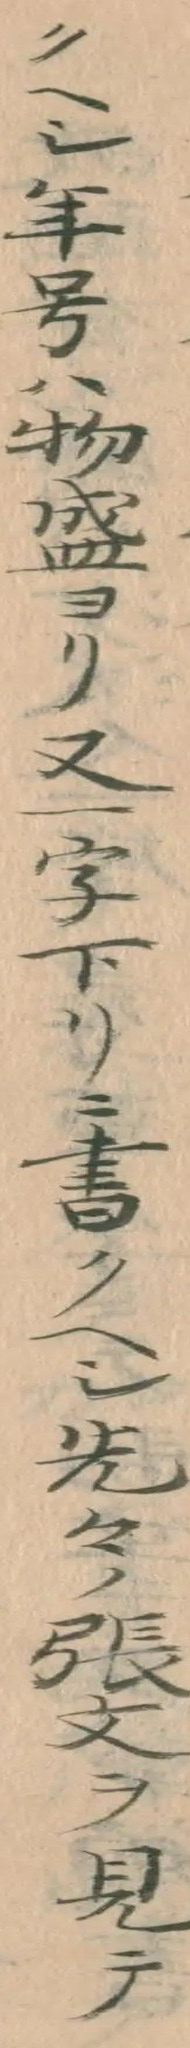クベシ年号ハ物盛ヨリ又一字下リニ書クヘシ先々ノ張文ヲ見テ
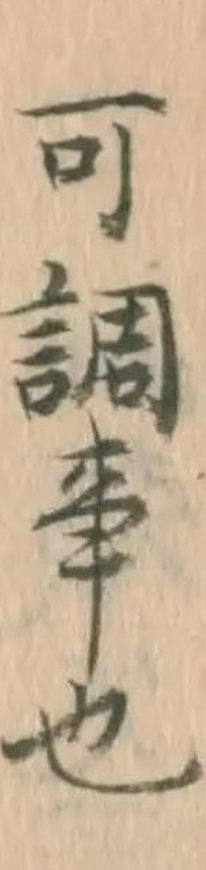可調事也
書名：賀茂社記録. 第40冊
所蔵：国立国会図書館 National Diet Library, JAPAN
